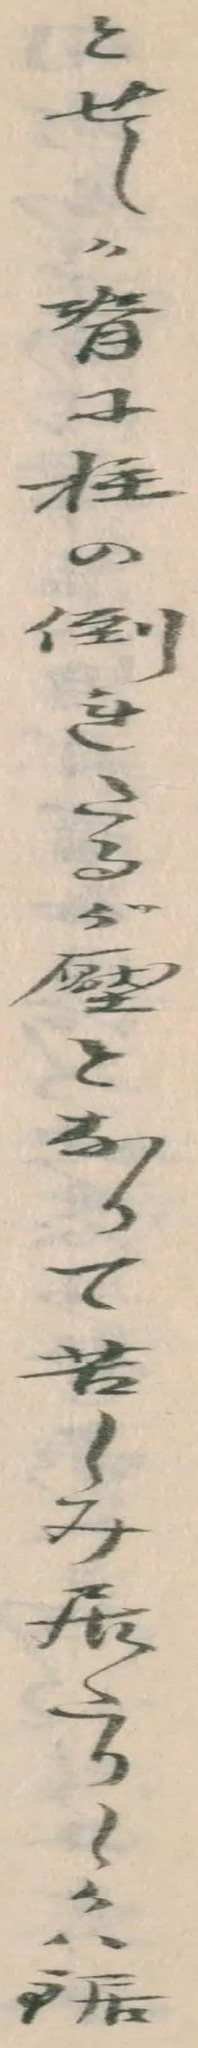とせしか背に柱の倒れたるが圧となりて苦しみ居たりしかは鋸
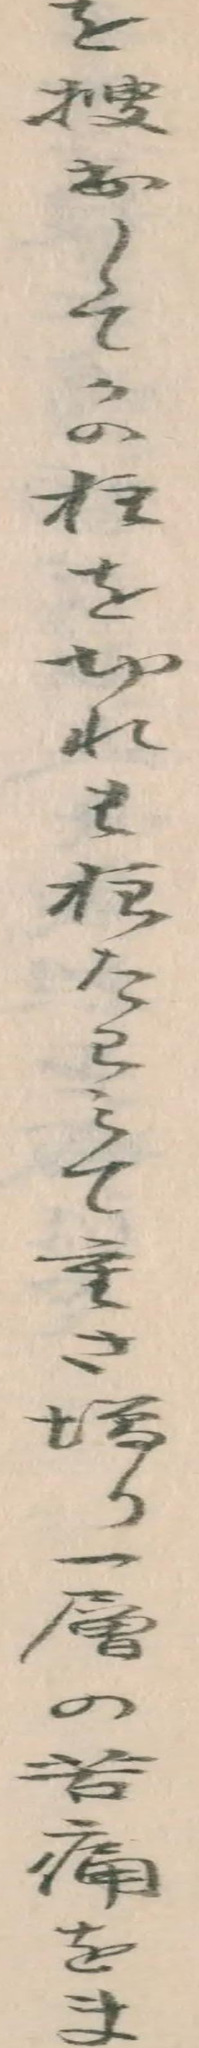を捜出してかの柱を切れは柱たわみて重さ増り一層の苦痛をま
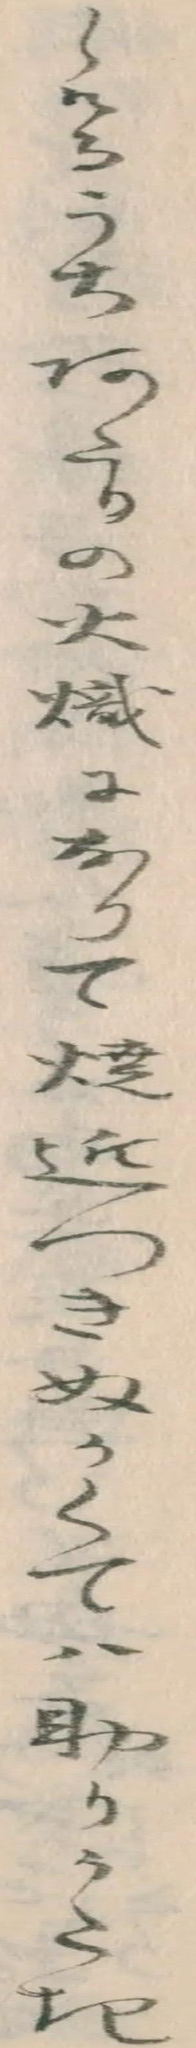しけるうちあたりの火熾になりて焼近つきぬかくては助りかたき
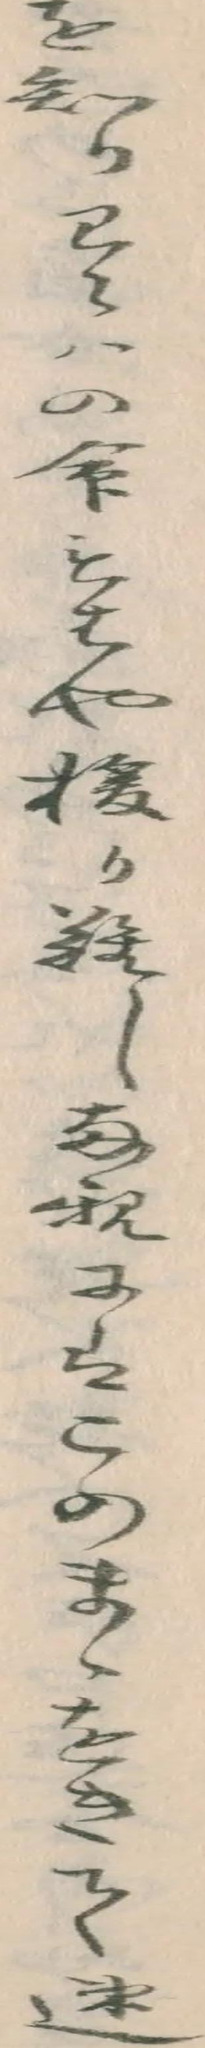を知りわらはの命もはや援り難し両親にはこのまゝをきて速
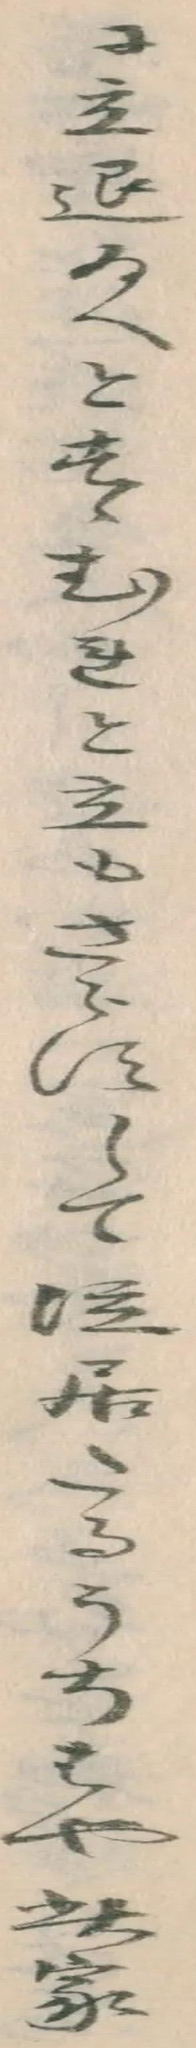に立退給へとすゝむれと立もさらすして泣居たるうちはや此家
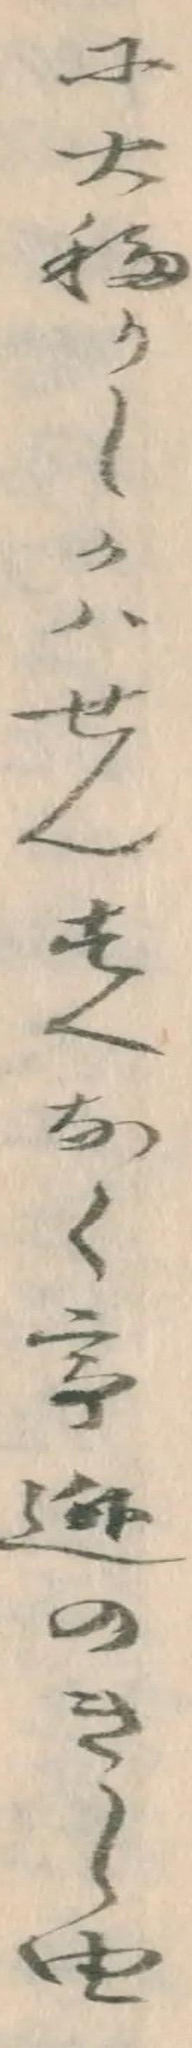に火移りしかはせんすへなくて逃のきし由

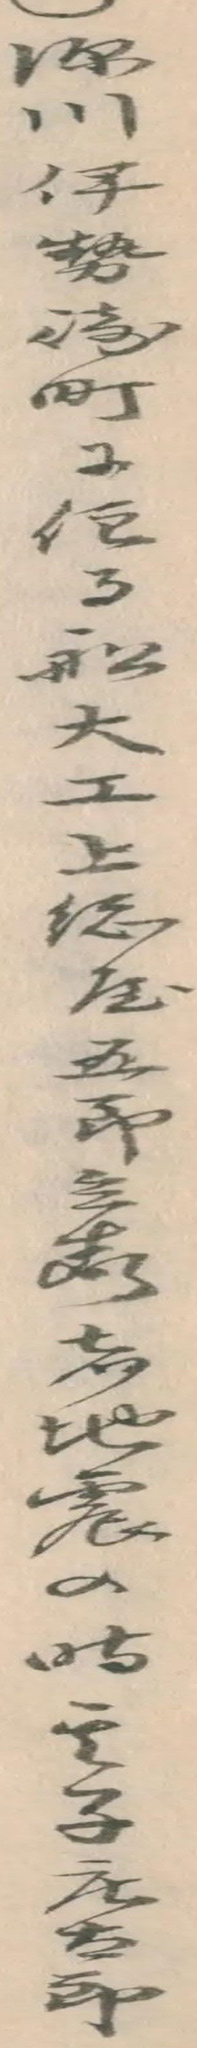〇深川伊勢崎町に住る船大工上総屋五郎兵衛は地震の時其子庄太郎
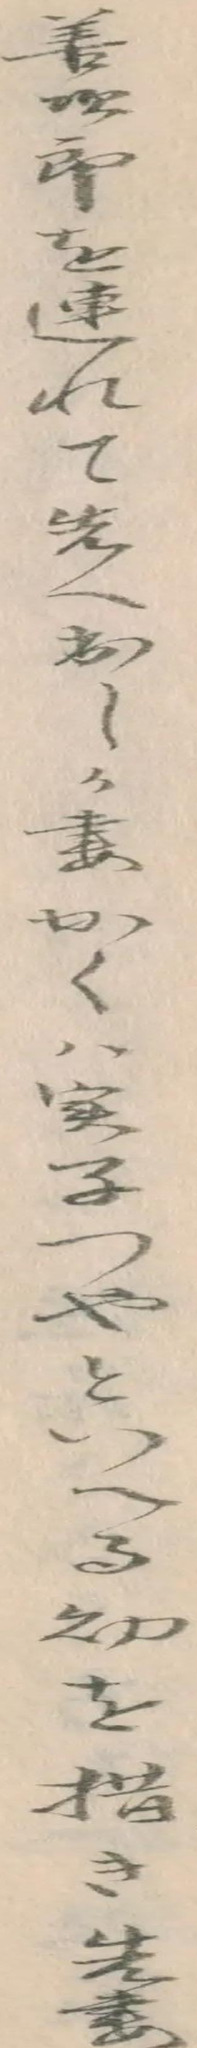善次郎を連れて先へ出しか妻かくは実子つやといへる幼を措き先妻
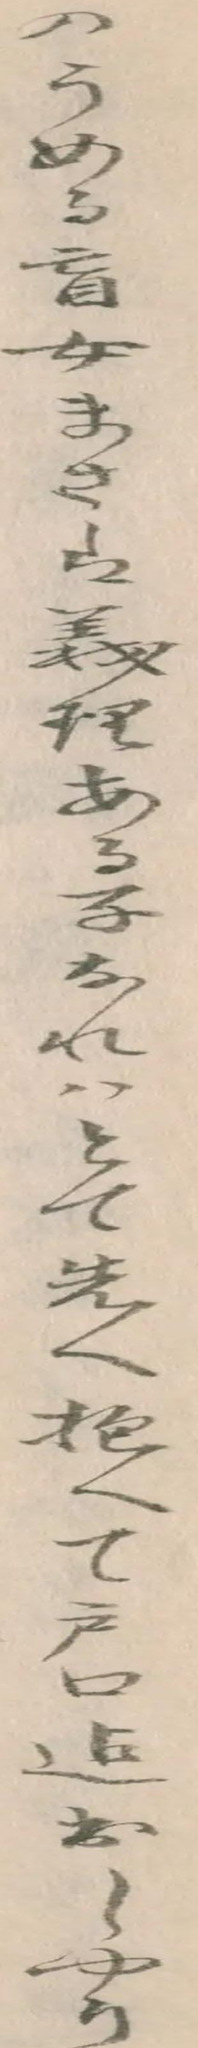のうめる盲女まさは義理ある子なれはとて先へ抱へて戸口迄出しやり
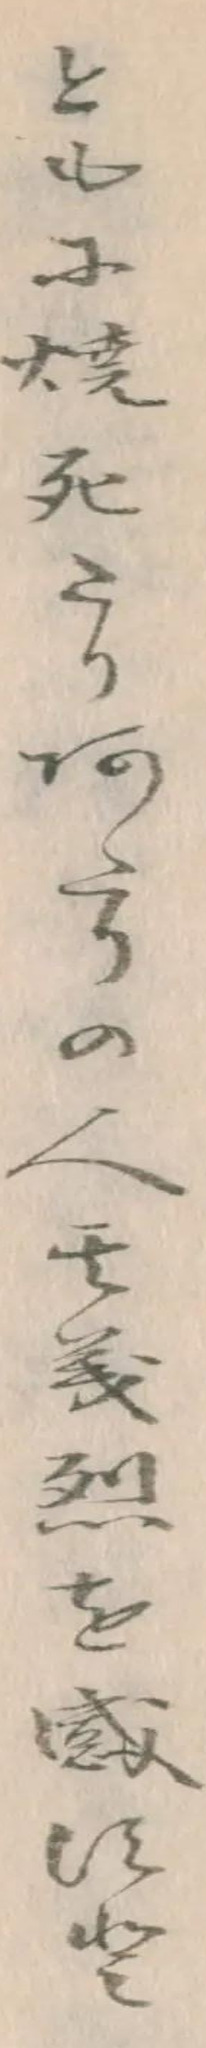ともに焼死たりあたりの人其義烈を感すと
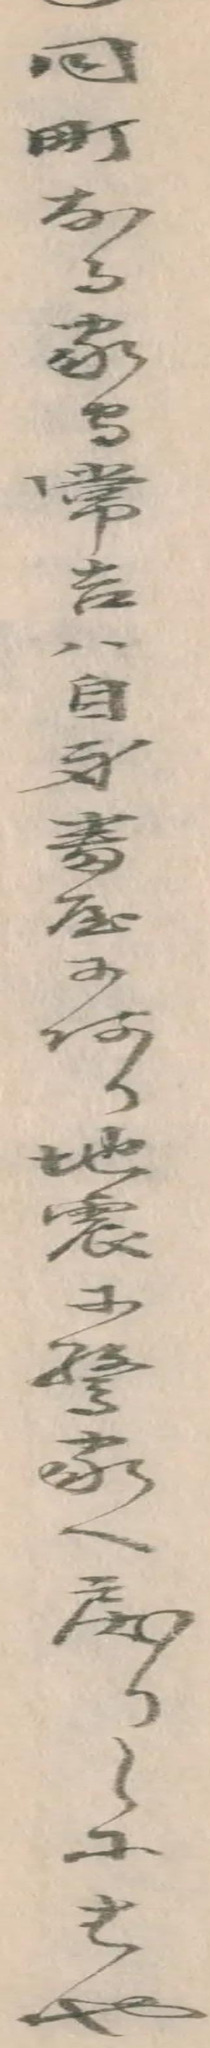〇同町なる家守常吉は自身番屋にあり地震に驚家へ戻りしにはや
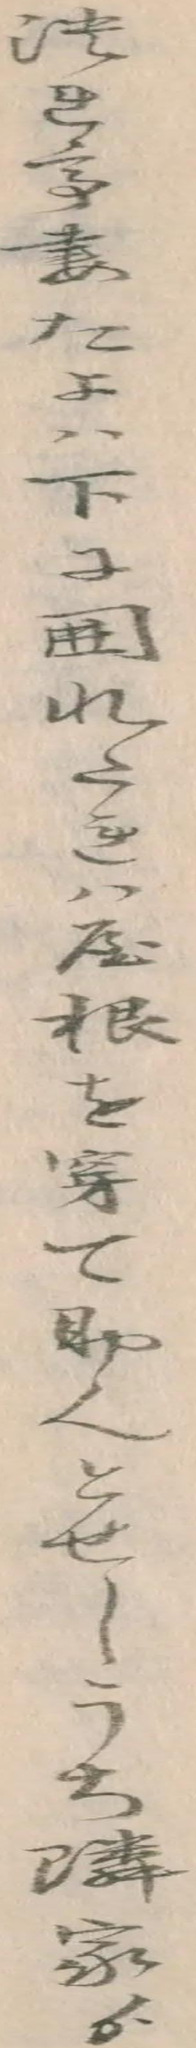潰れて妻たよは下に囲れたれは屋根を穿て助んとせしうち隣家ゟ
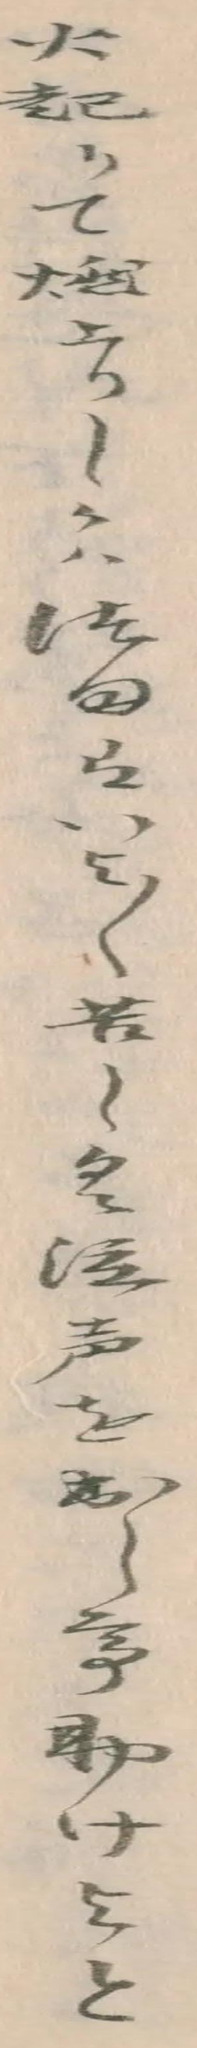火起りて燃上りしかはつまはいよ〳〵苦しく泣声を出して助けよと
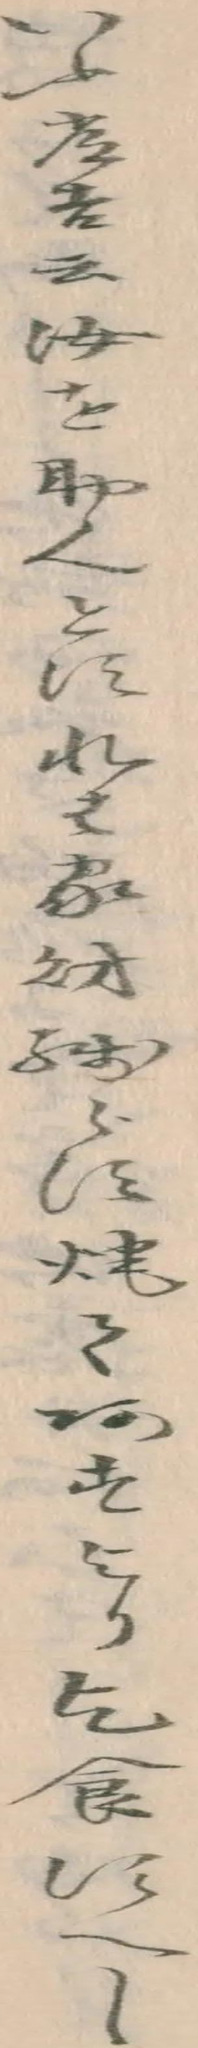いふ常吉云汝を助んとすれは家財残らす焼て阿すより乞食すへし
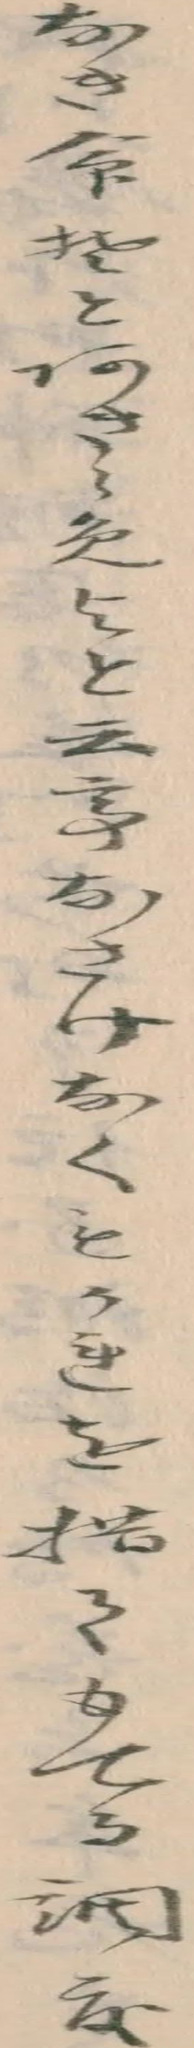なき命そとあきらめよと云てなさけなくもかれを措てもてる調度
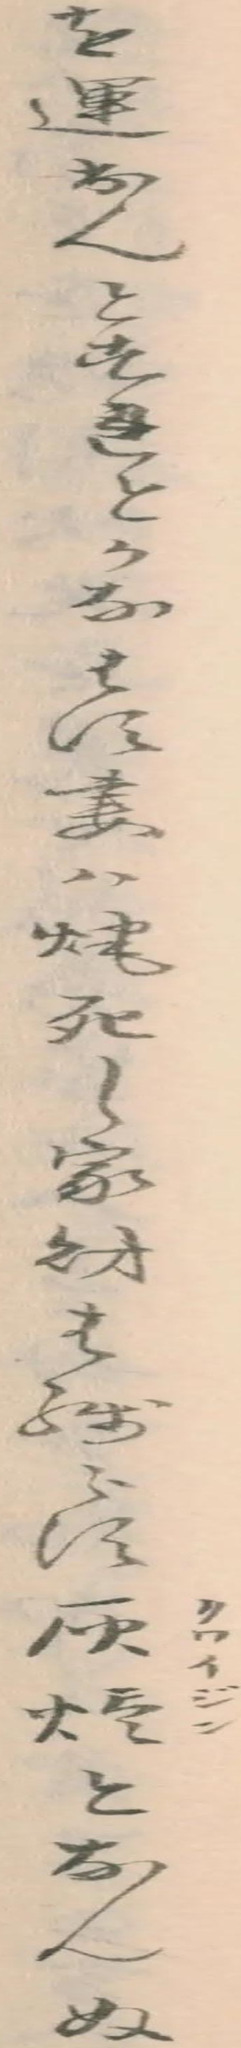を運出んとすれとかなはす妻は焼死し家財は残らす灰燼となんぬ
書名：地災撮要. 巻10(地震之部) 上,下
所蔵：国立国会図書館 National Diet Library, JAPAN
